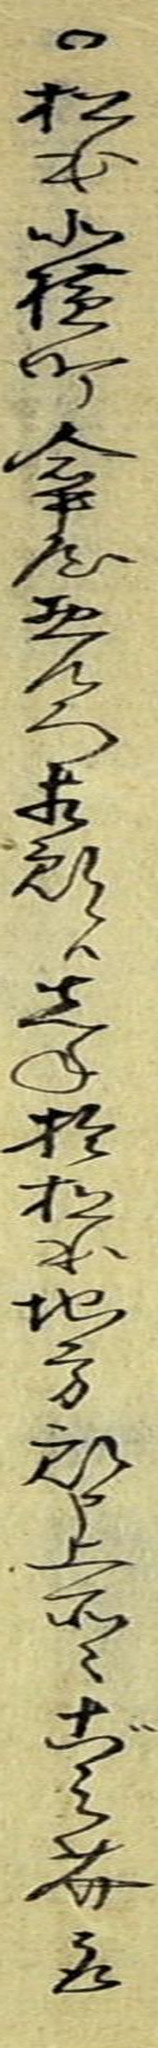○松本北横町傘屋惣左衛門相願候は先年於松本地方願申上所々ごミ芥取
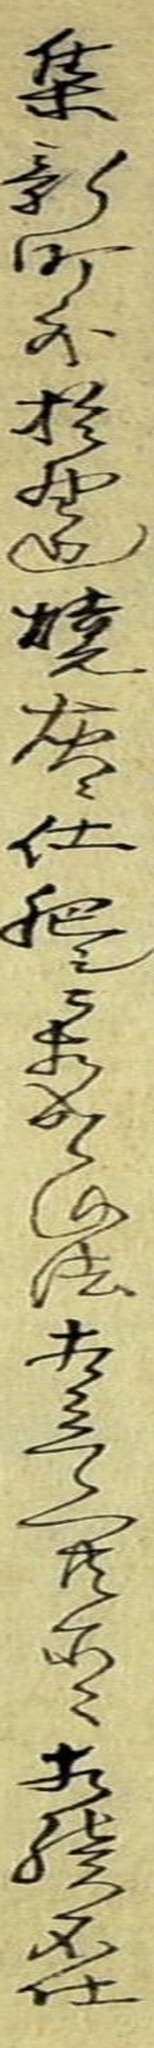集新町外於野辺焼灰に仕肥シに相成候趣法相立候へ共所々相続不仕
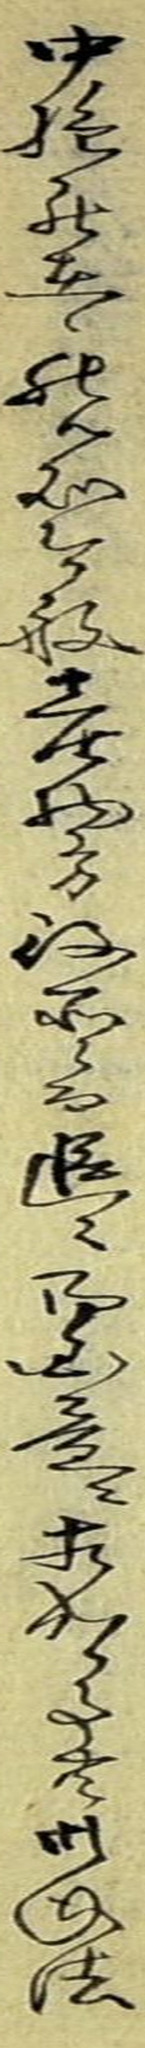中絶罷在候然ル処今般産物方役所に而追々御国産に相成候事共御趣法
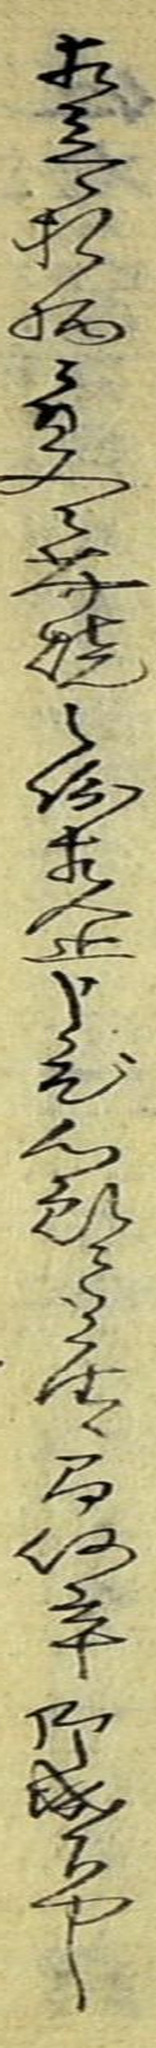相立候折柄に付又々芥焼之儀相企申度心願に御座候間何卒御城下中
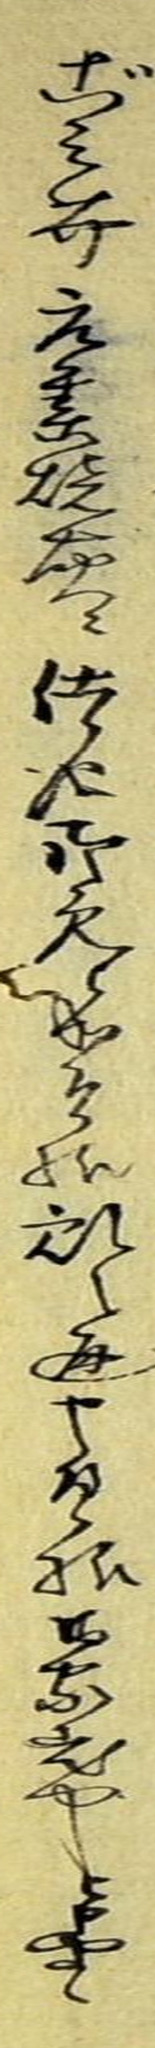ごミ芥取集焼灰に仕候儀御免被成下候様願之通申付候様御家老中被申聞候

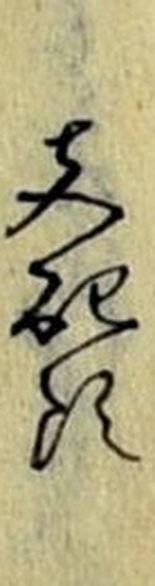支配頭
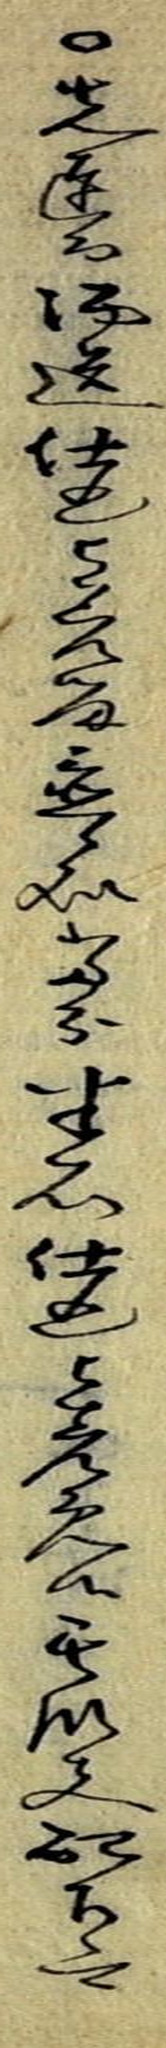○先達而酒造仕込被差留置候処当分半石仕込被差免候其段支配下へ可
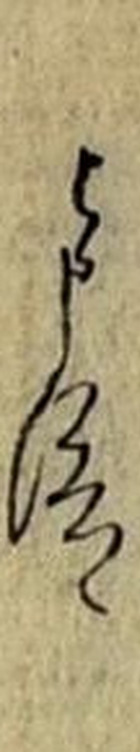被申渡候
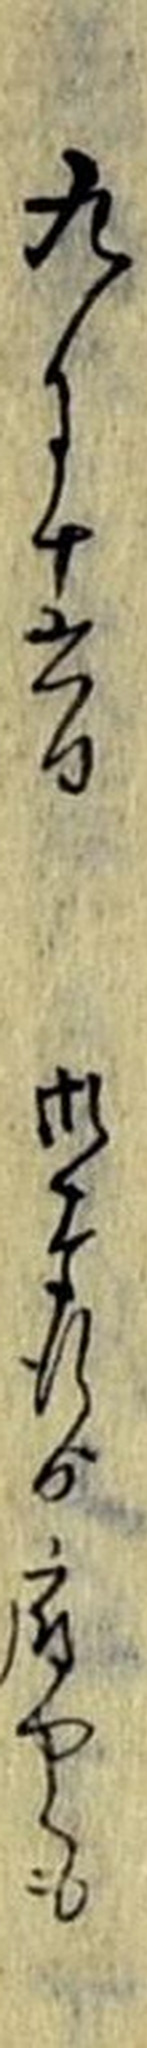九月十六日御奉行ゟ府中へも
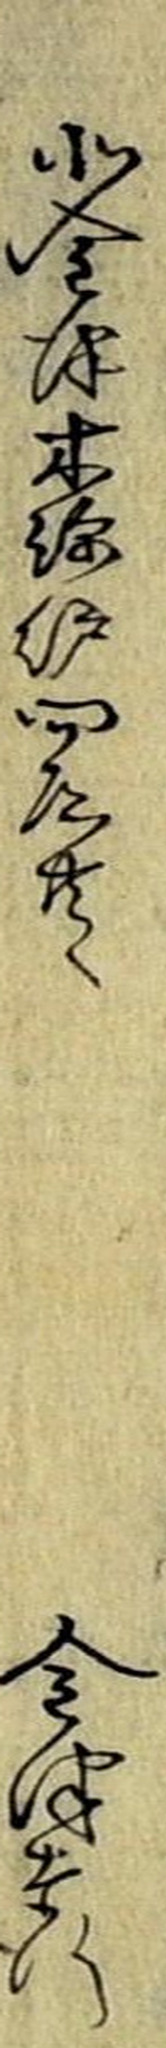北金津木綿䋆問屋共へ金津奉行
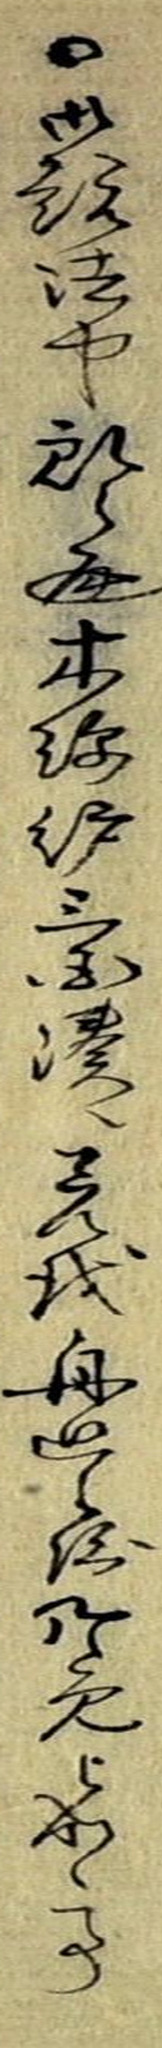○御趣法中願之通木綿䋆三国湊へ差越舟廻之儀御免被成候事
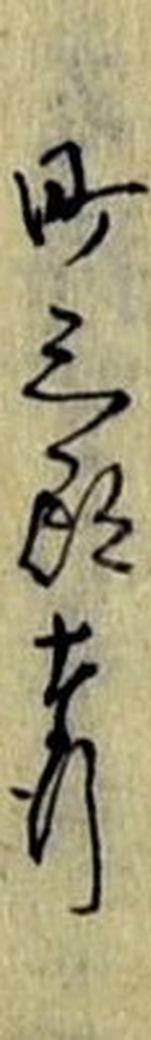町三郡奉行
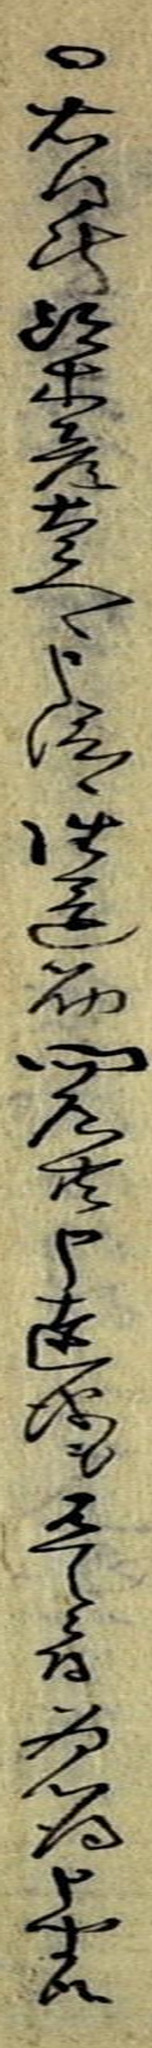○右同断鈴木彦太夫へ申渡候往還筋問屋共申達儀も有之候に付為心得申聞候
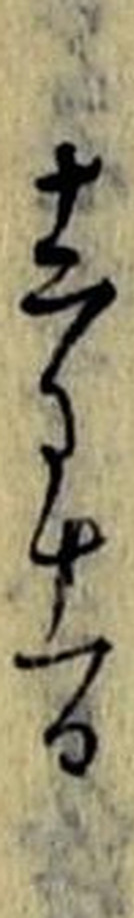十二月十一日
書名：命令之部 四
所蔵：福井県文書館 Fukui Prefectural Archives
